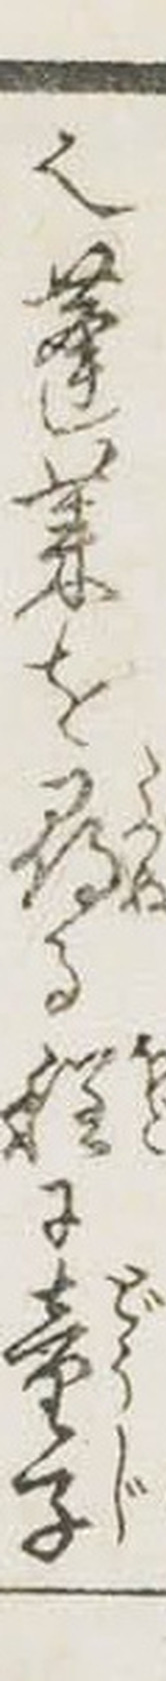也蓬莱を尋る程に童子
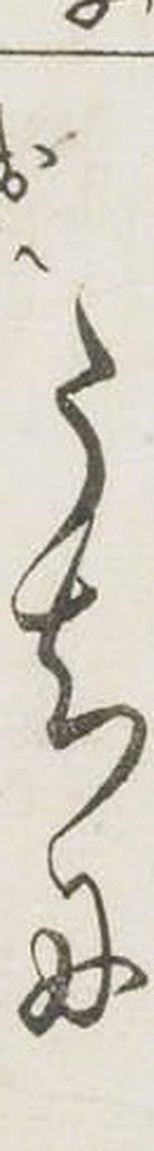うちに
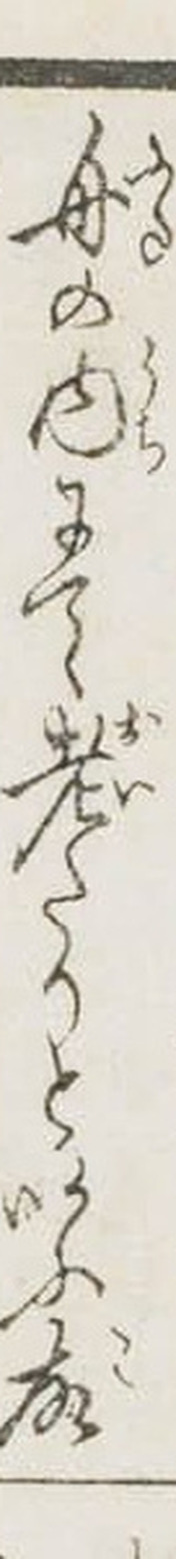舟の内にて老たりといふ故
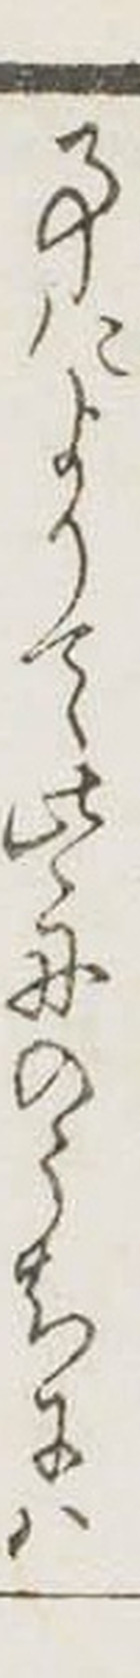事によりて此舟のうちには
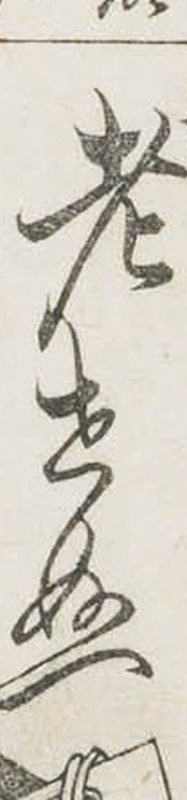老せぬ
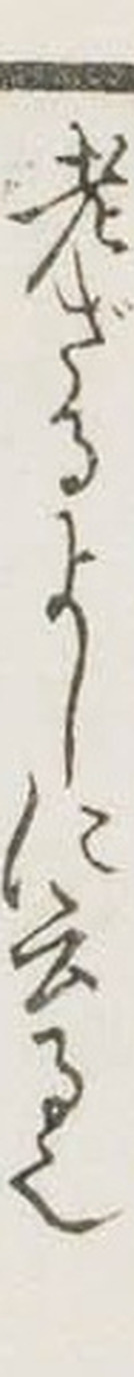老ざるよしに云る也
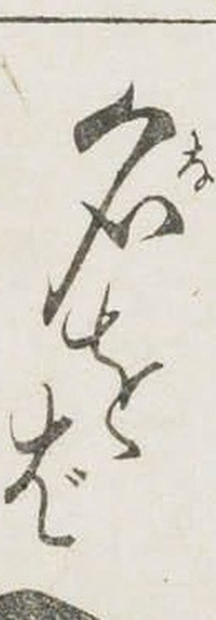名をば
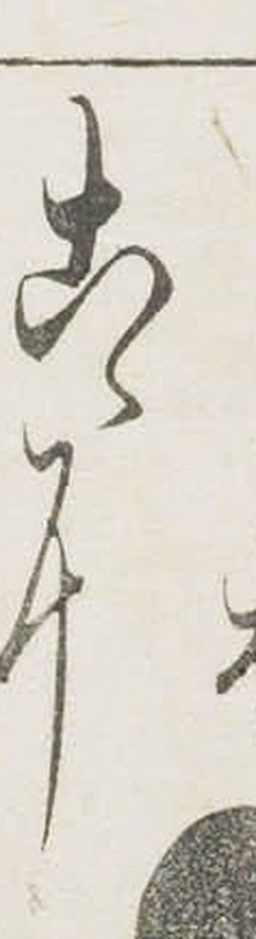こゝに
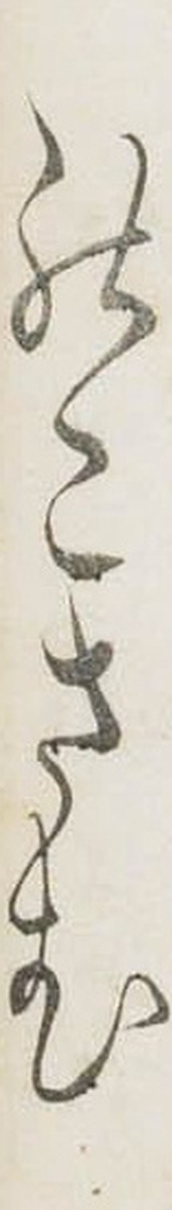のこさむ
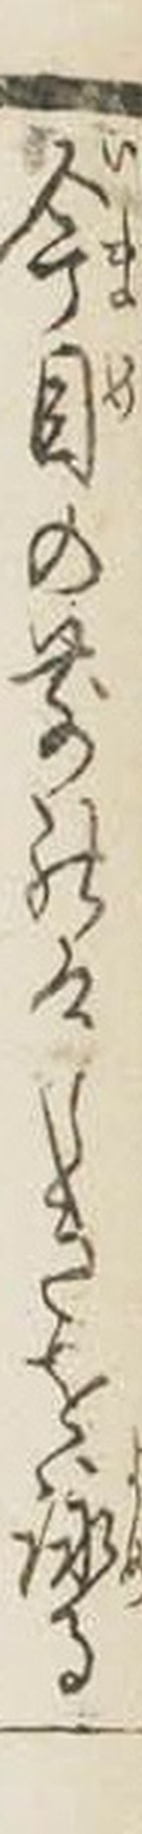今目の前のけしきを詠る
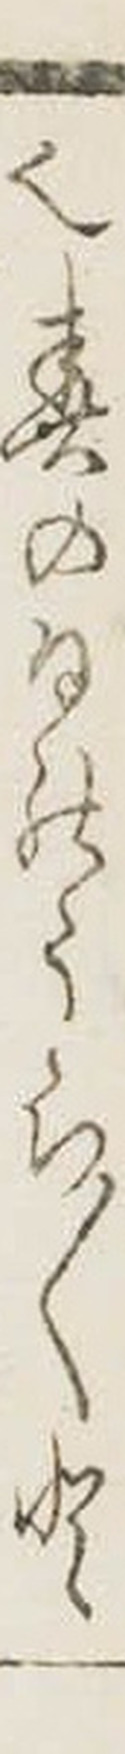也春の日のうら〳〵と
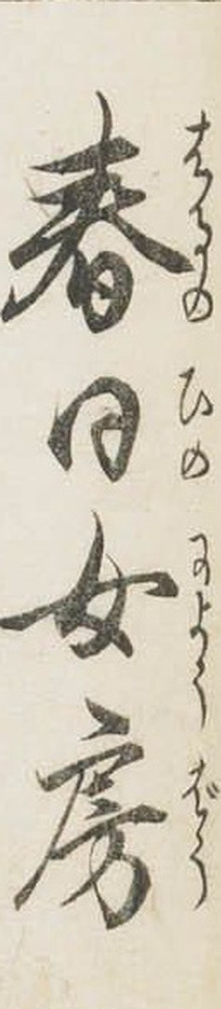春日女房
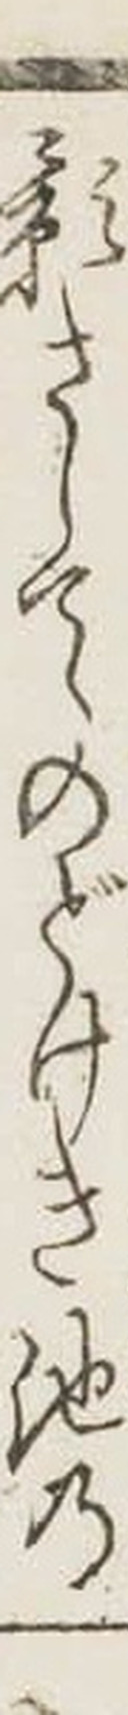影さしてのどけき池の
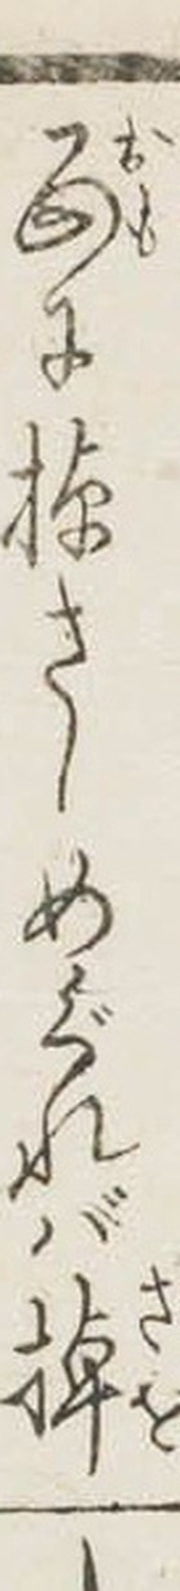面に棹さしめぐれば棹
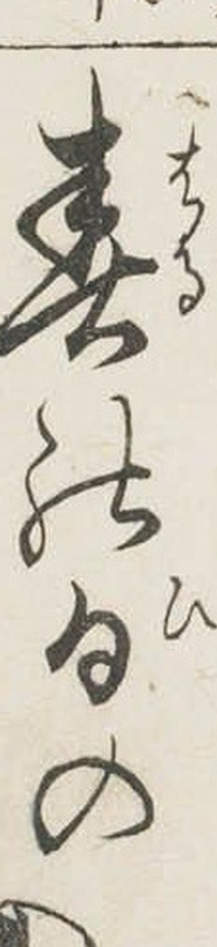春の日の
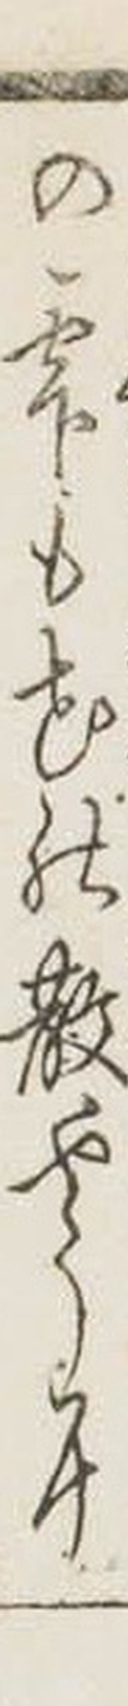の雫も花の散やうに
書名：源氏百人一首
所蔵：東京学芸大学教育コンテンツアーカイブ
